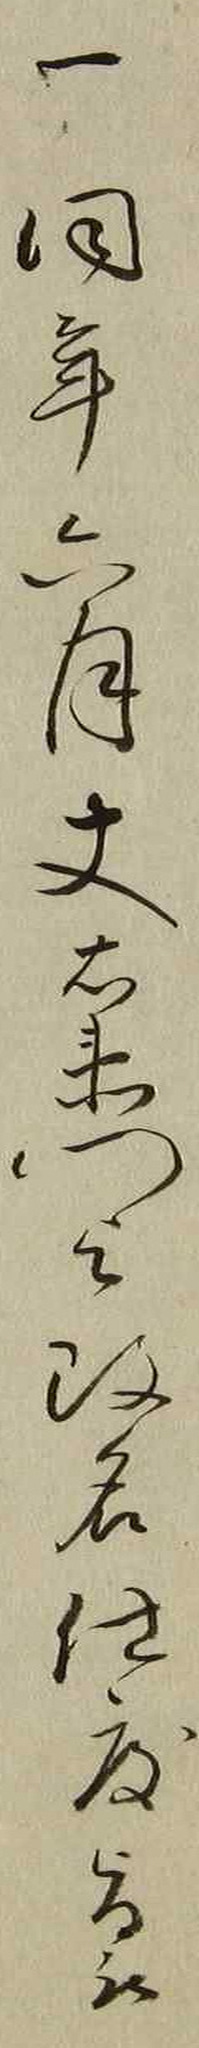一同年六月丈右衛門と改名仕度旨被
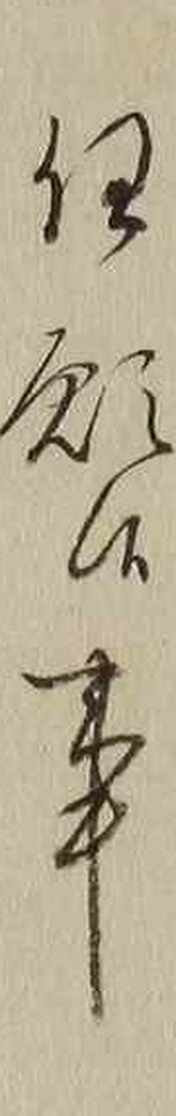任願候事
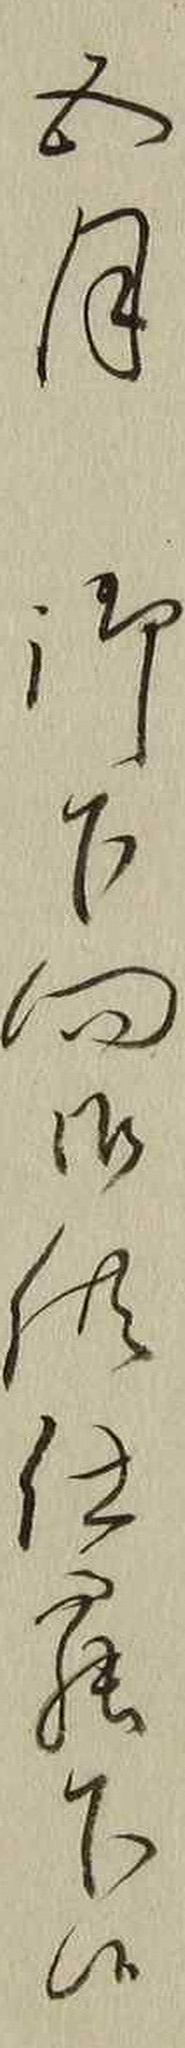五月御下向御供仕罷下候
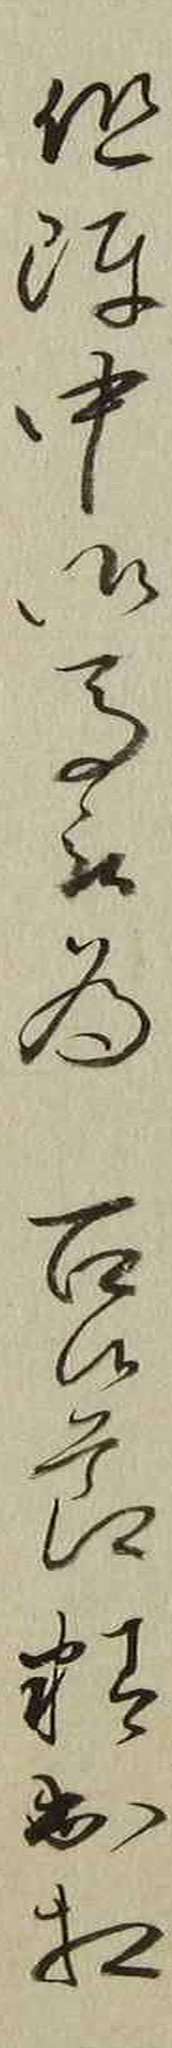但陣中御馬被為召候節精出相
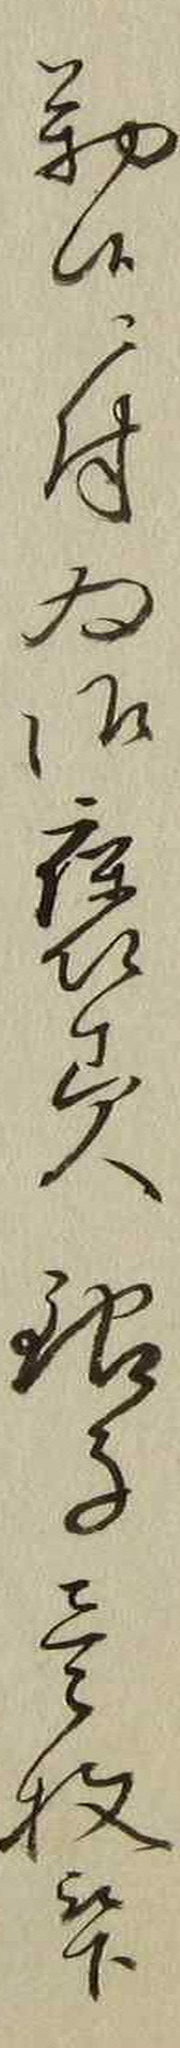勤候ニ付為御褒美銀子壱枚被下
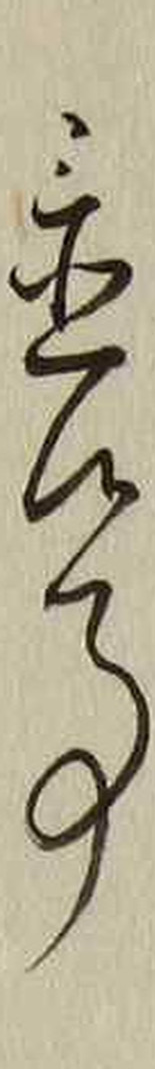置候事
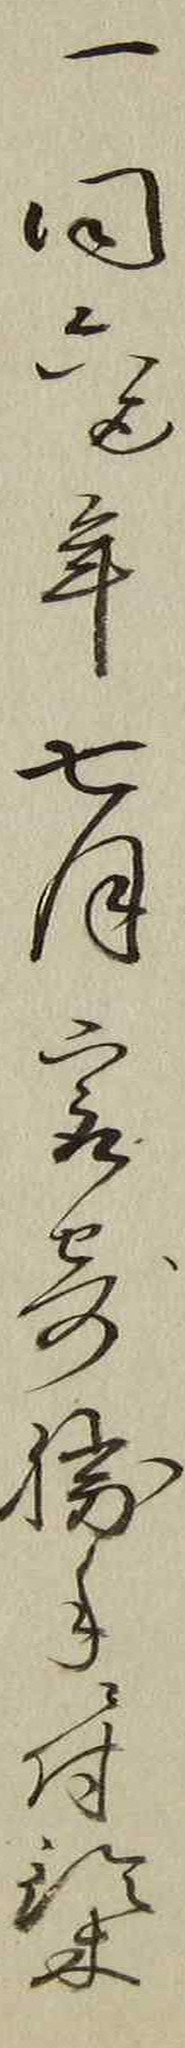一同六酉年七月最寄勝手ニ付鈴木
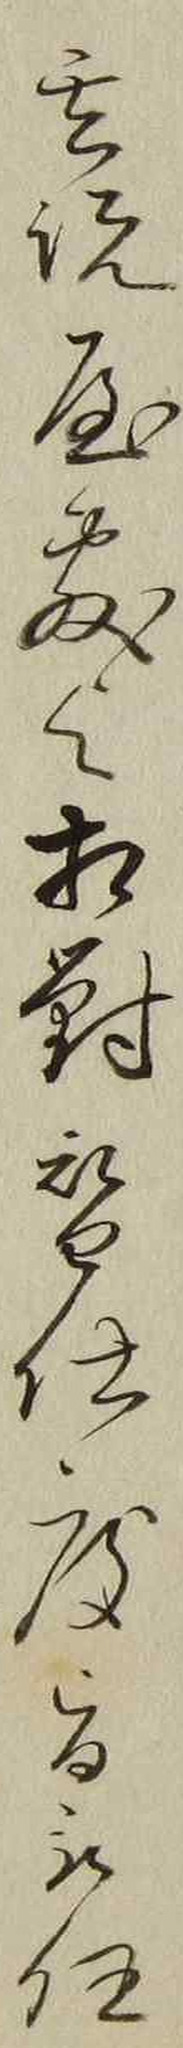玄説屋敷と相対替仕度旨被任
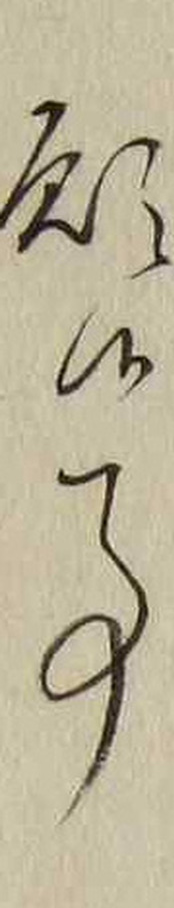願候事
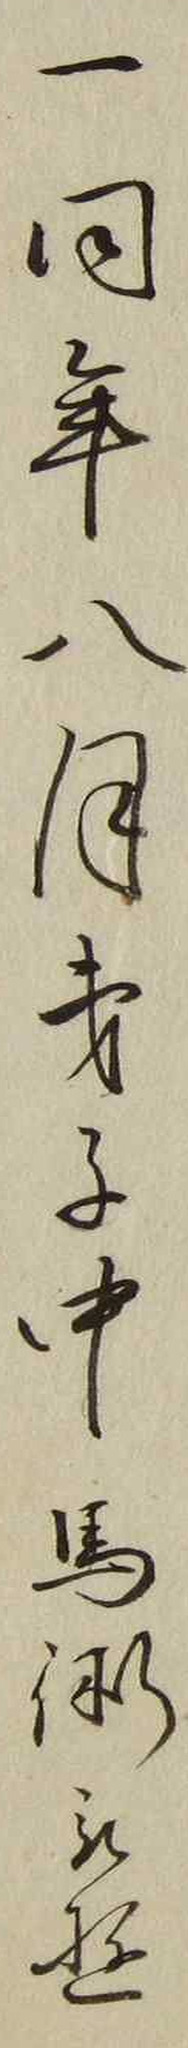一同年八月弟子中馬術被遊

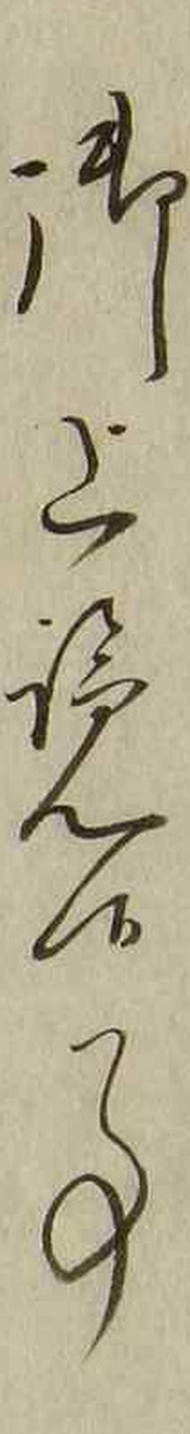御上覧候事
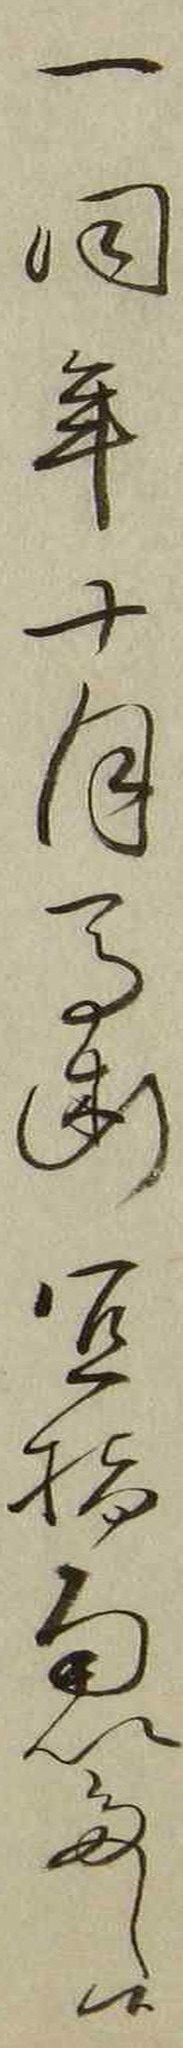一同年十月馬術宜指南いたし候
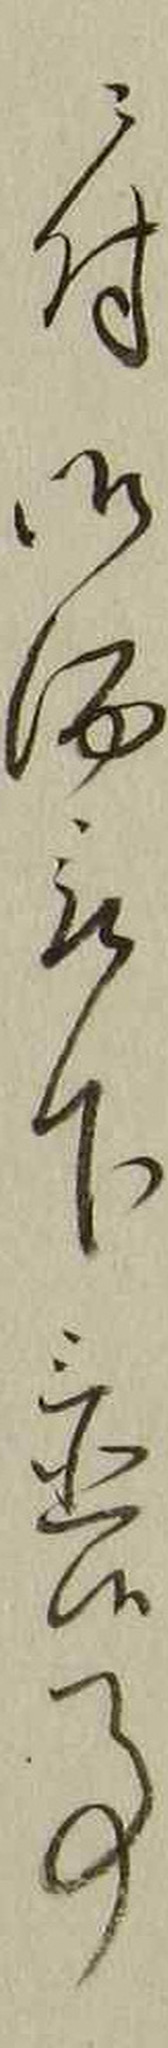ニ付御酒被下置候事
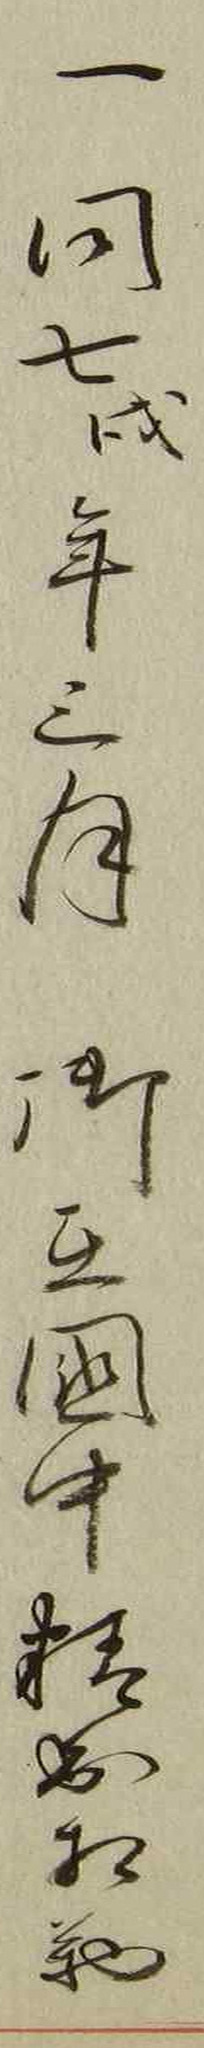一同七戌年三月御在国中精出相勤
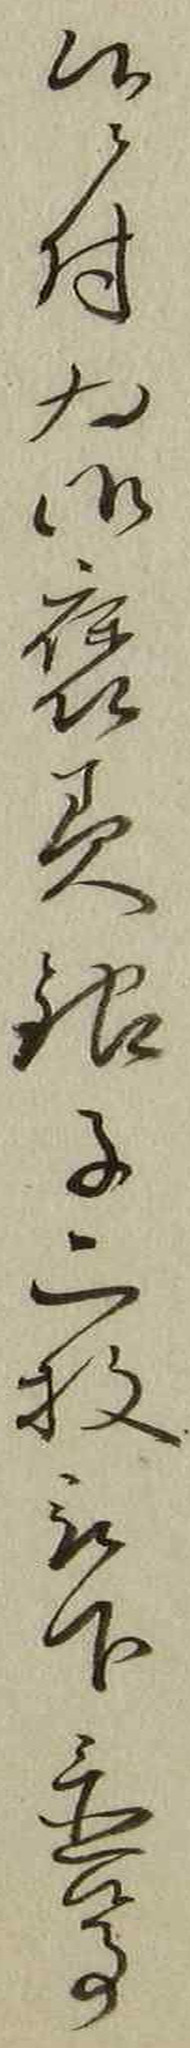候ニ付為御褒美銀子二枚被下置候事
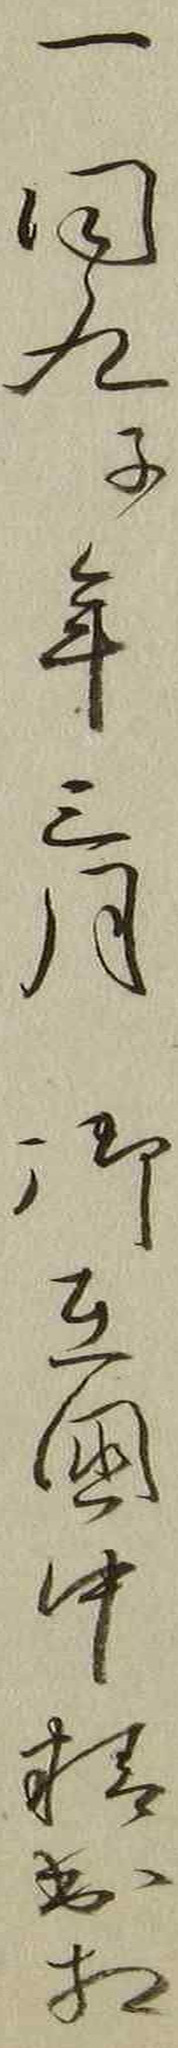一同九子年三月御在国中精出相
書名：諸士系譜　巻之3　い之部3
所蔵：会津若松市立会津図書館
